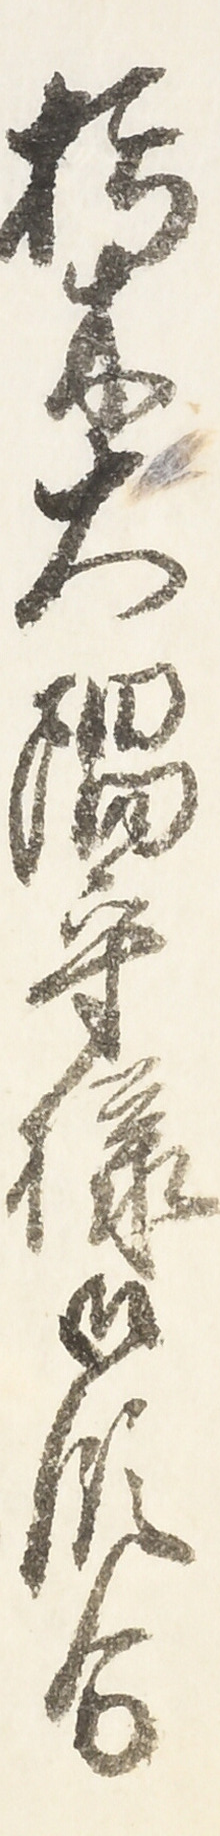朽木大隅守様御領分
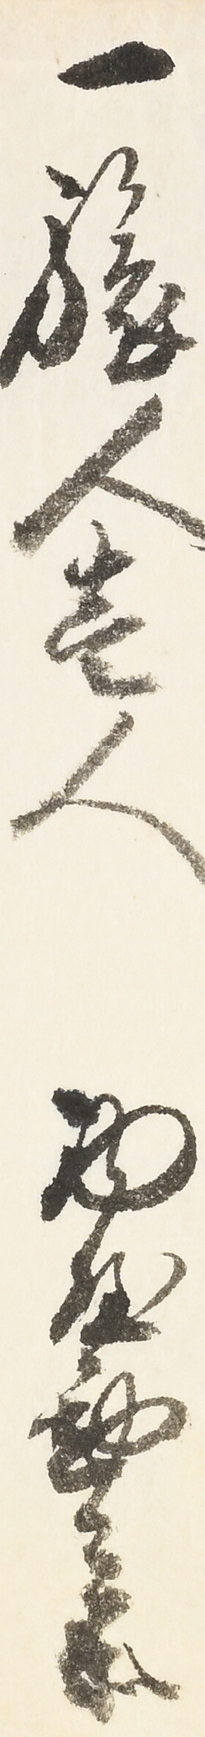一旅人壱人物屋勘兵衛
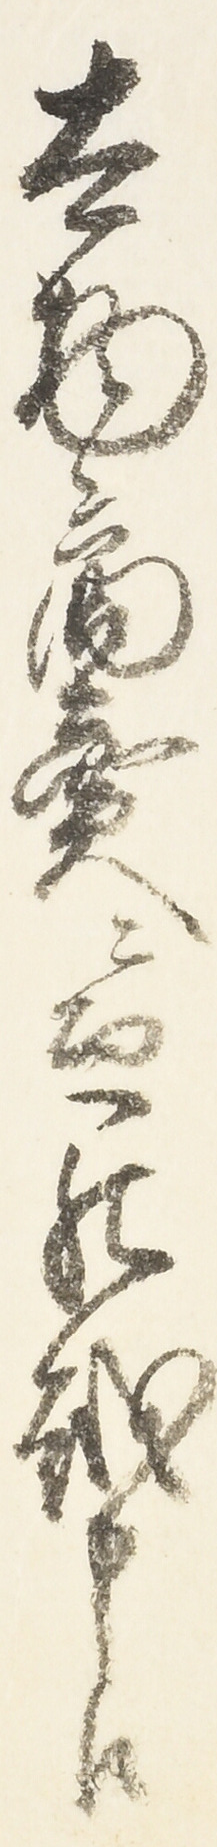太物商売ニ而罷越申候
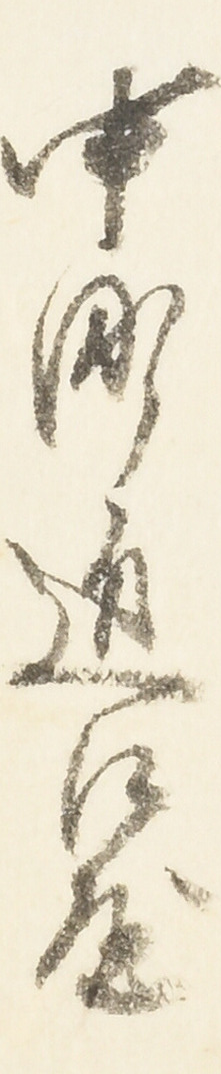中町近江屋
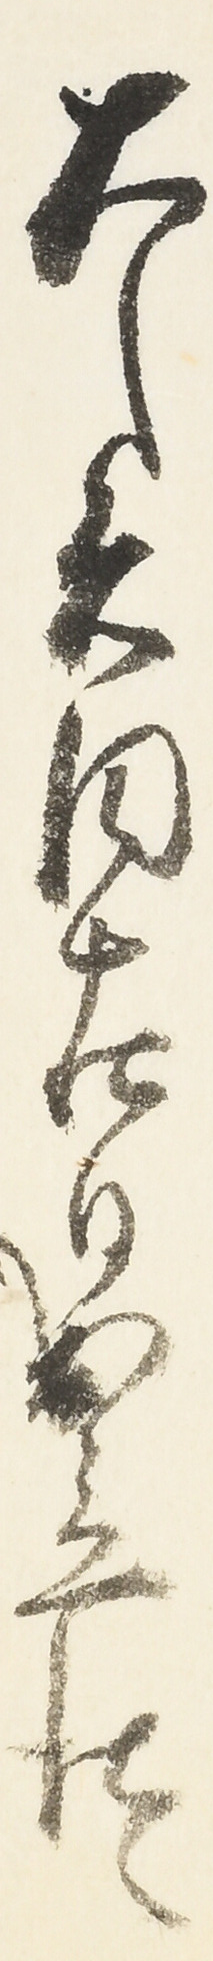右之者同十四日出立仕候
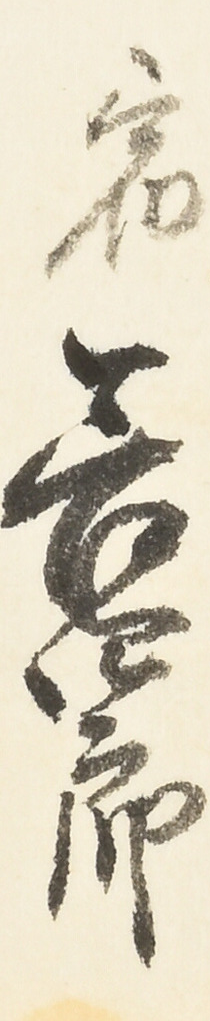宿善四郎
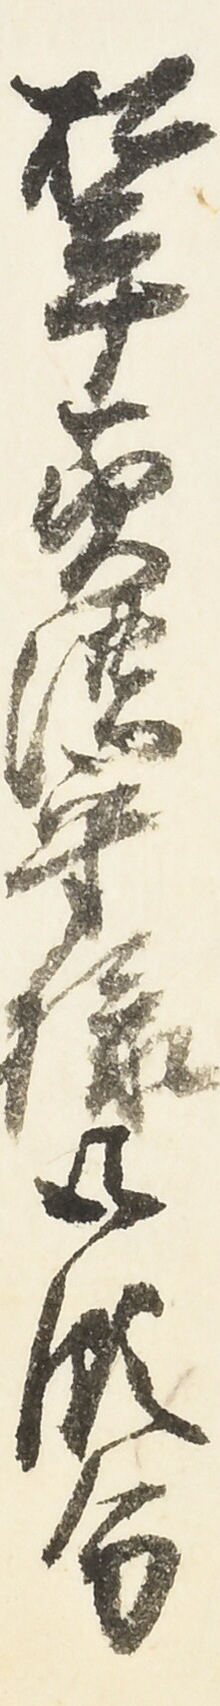松平美濃守様御領分
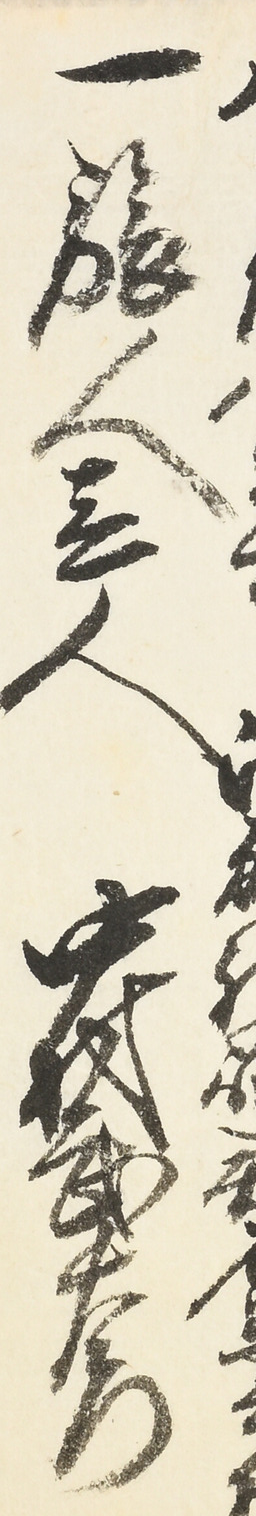一旅人壱人中村武右衛門
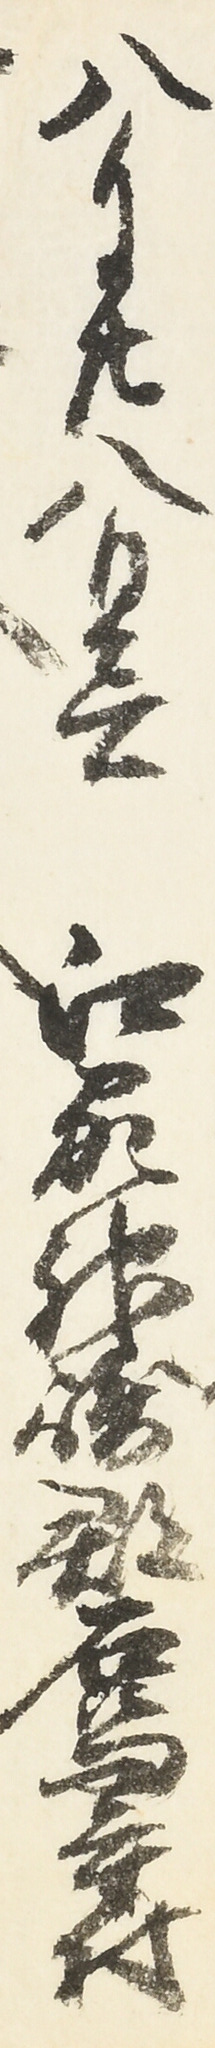八月廿八日着江州神崎郡石馬寺村
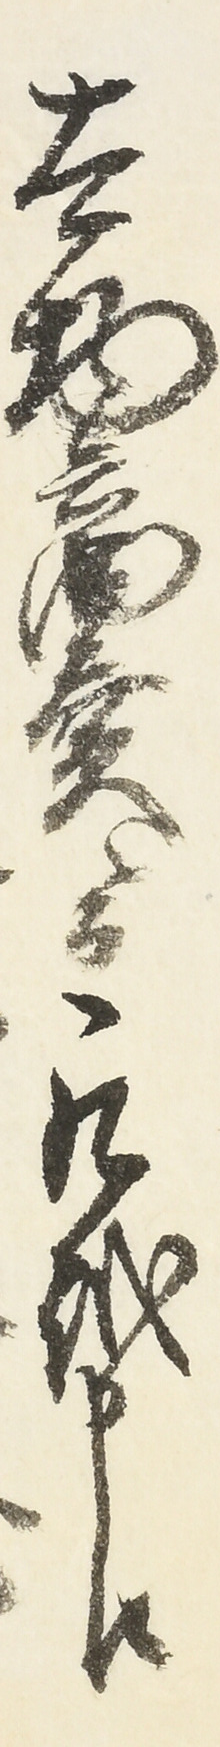太物商売ニ而罷越申候
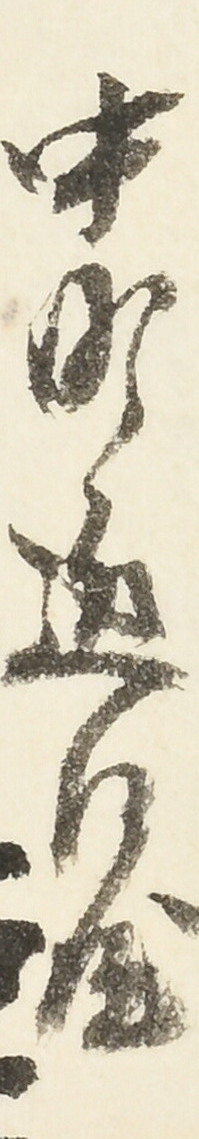中町近江屋
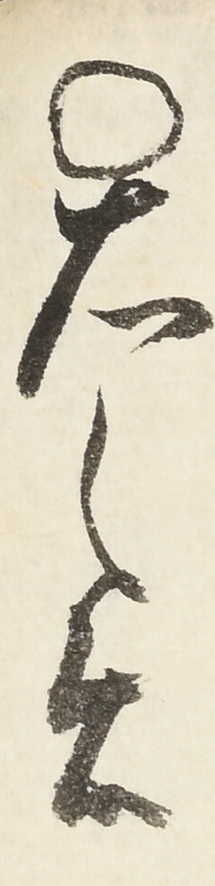〇右之者

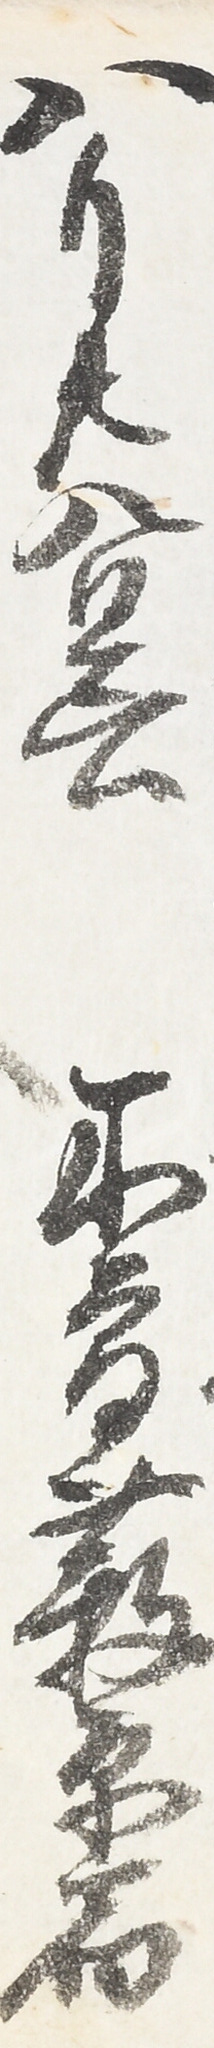八月廿八日着木曽藪原宿
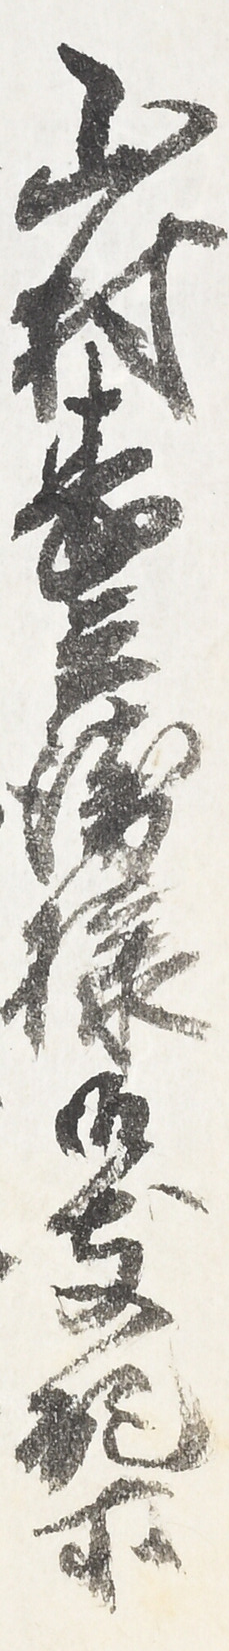山村甚兵衛様御支配所
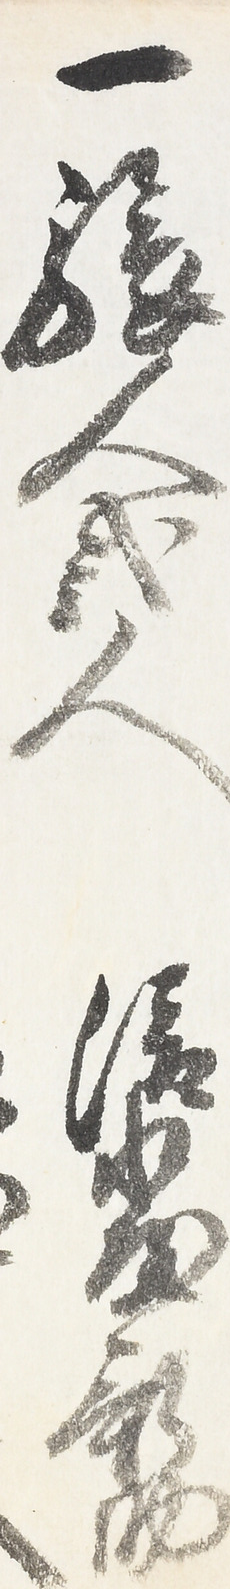一旅人弐人清水屋新助
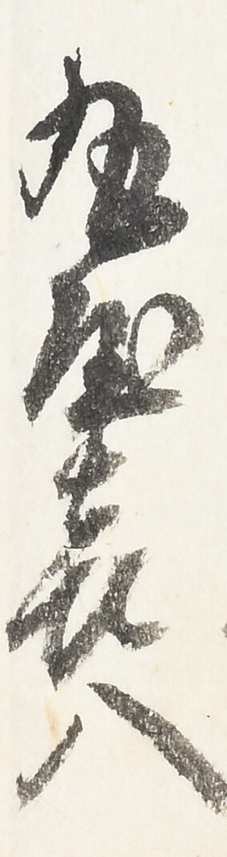丸屋喜八
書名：町中旅人泊控帳
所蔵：伊那市立高遠町図書館・合同会社AMANE
